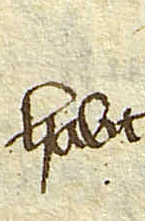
habt
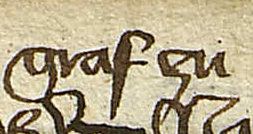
graf cʒu
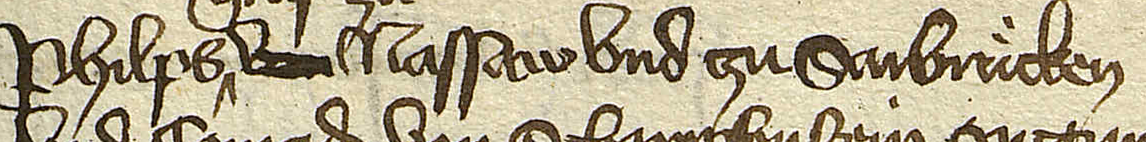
Philps von Naſſaw vnd cʒu Sarbrücken
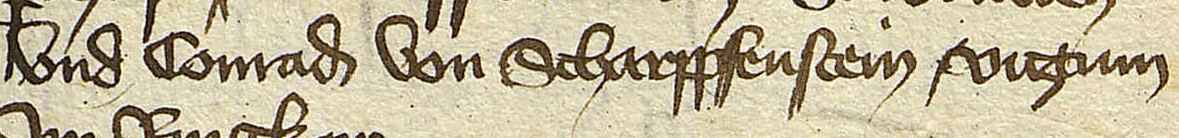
vnd Conrad* von Scharppfenſtein / vicʒtum
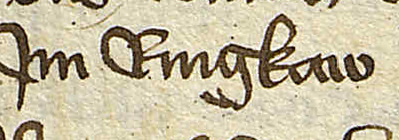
Im Ringkaw
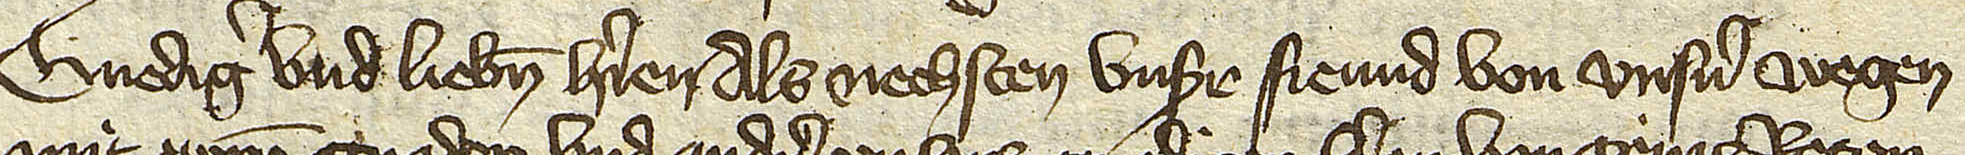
Gnedig* vnd liebn* h*ren / Als nechſten vnſ*r freund von vnſn* wegen
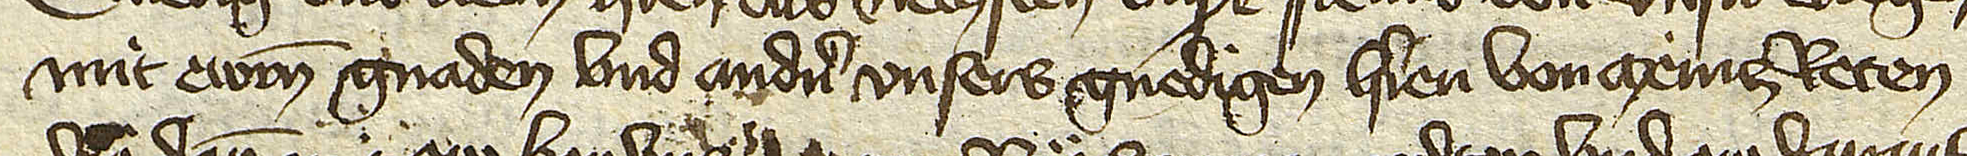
mit ewrn* gnaden vnd andn* vnſers gnedigen h*ren von Meincʒ Reten
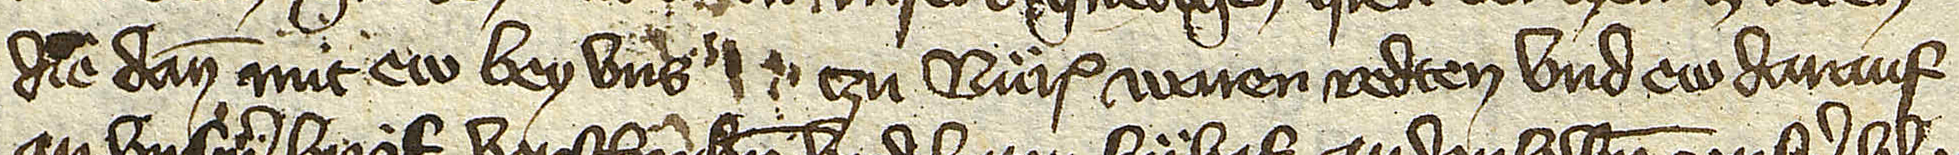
die dan* mit ew bey vns cʒu Nür* waren redten vnd ew darauf
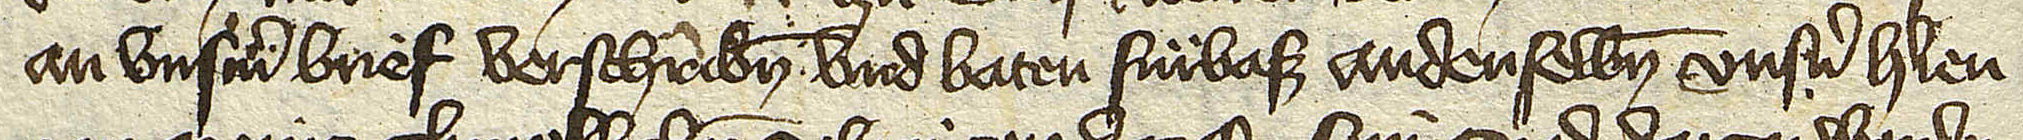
an vnſm* brief verſchribn* vnd baten fürbaſʒ andenſelbn* vnſn* h*ren
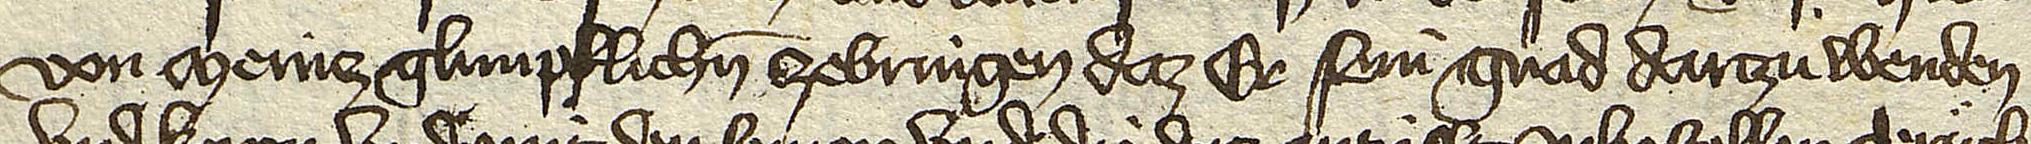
von Meincʒ glimpflichn* cʒebringen daʒ Er ſein gnad darcʒu wenden
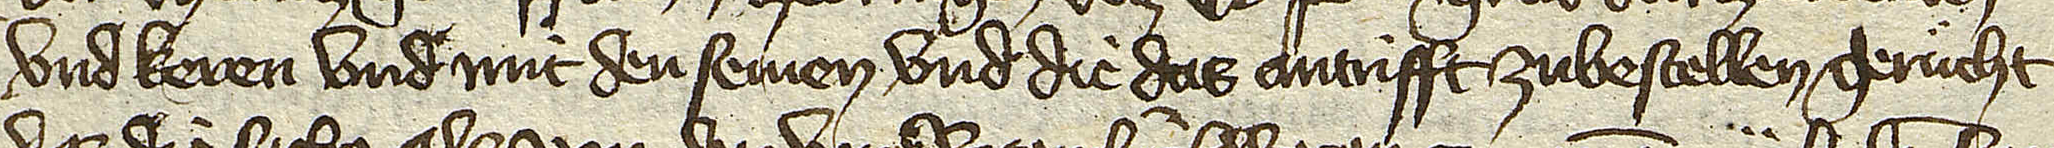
vnd keren vnd mit den ſeinen vnd die das antrifft cʒubeſtellen gerücht
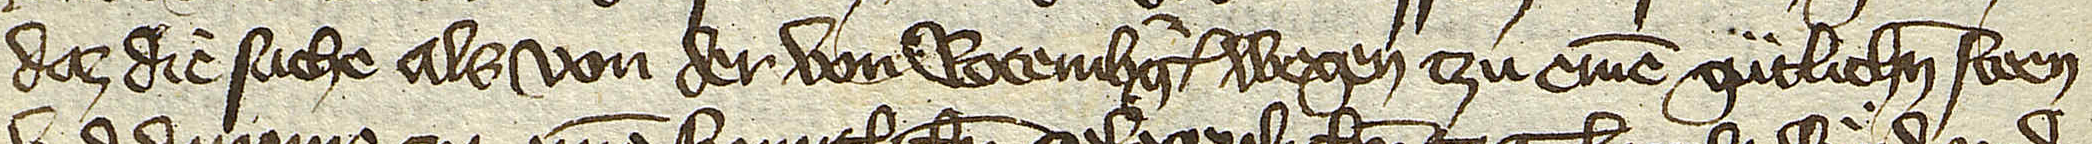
daʒ die ſache als von der von Rotemb*g* wegen cʒu eine* gütlichn* ſteen
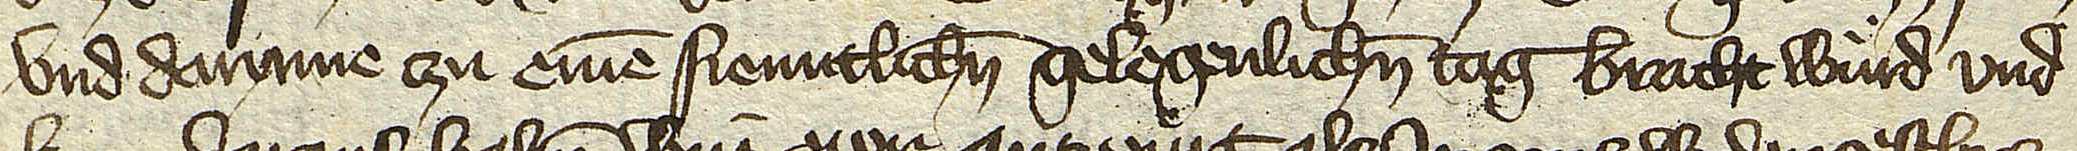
vnd darynne cʒ eine* freuntlichn* gelegenlichn* tag bracht würd vnd
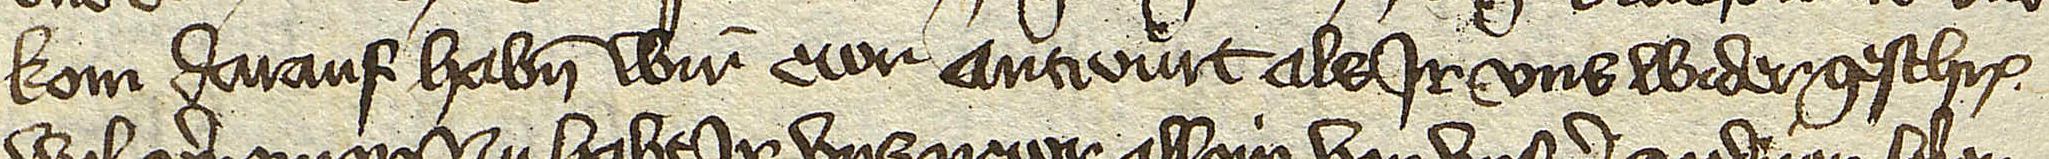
kom darauf habn* wir ewr antwürt als Ir vns wider geſchr*
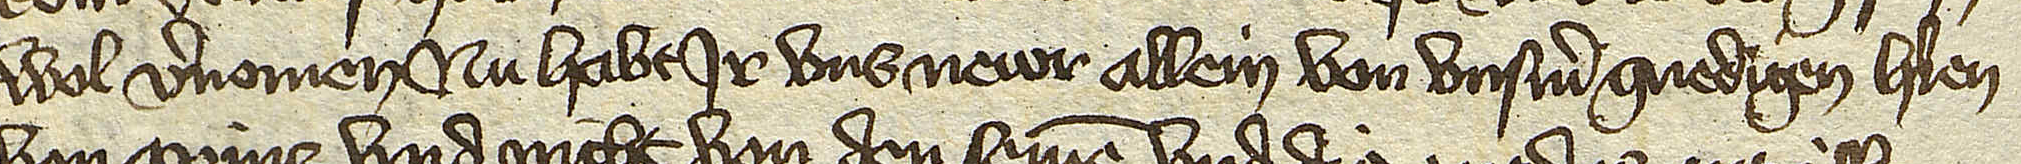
wol v*nomen Nu habt Ir vns newr allein von vnſm* gnedigen h*ren
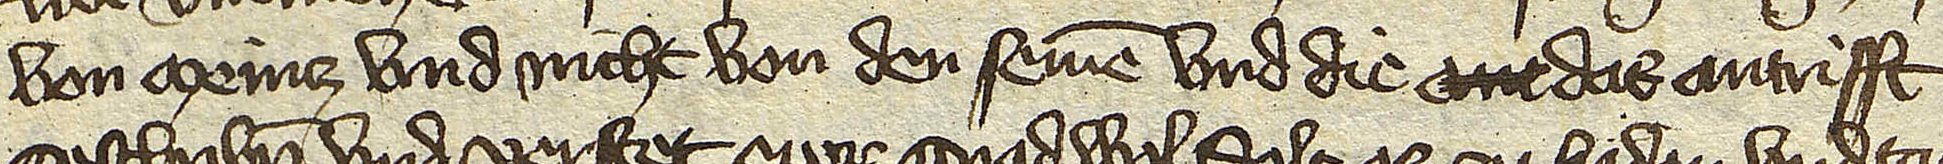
von Meincʒ vnd nicht von den ſeine* vnd die an das antrifft
